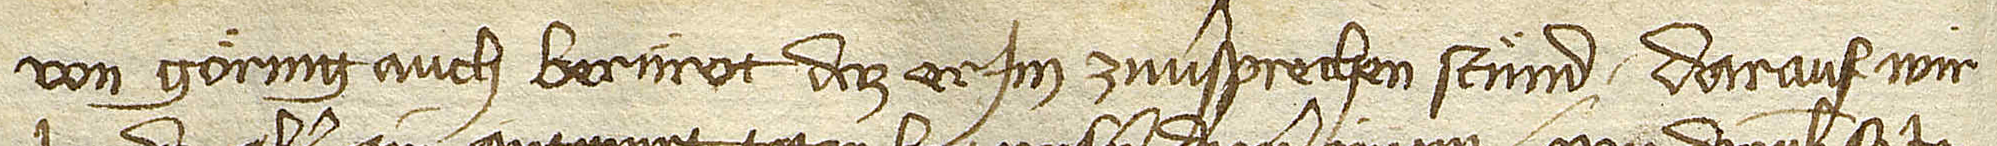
von görnig auch berüret daʒ er Im ʒuu*ſprechen ſtünd / Darauf wir
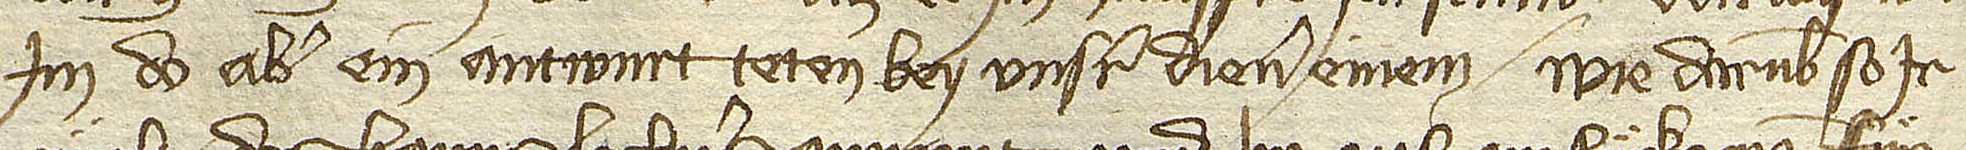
Im do ab* ein antwurt teten bey vnſ*r dien* einem / wie daru*b ſo Ir
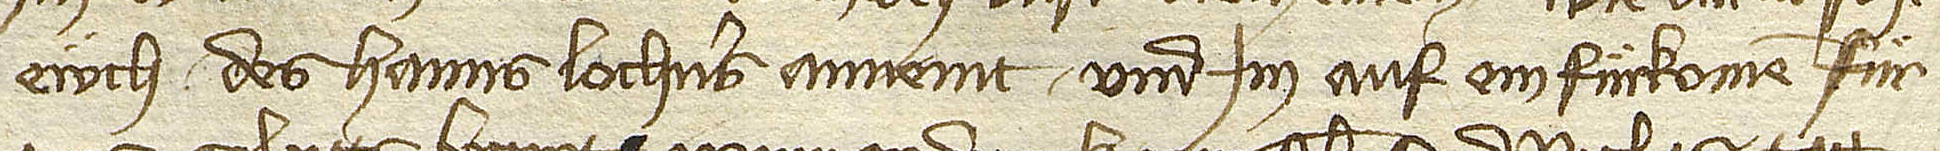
ewch / des hanns lochn*s annemt / vnd Im auf ein fürkome* für
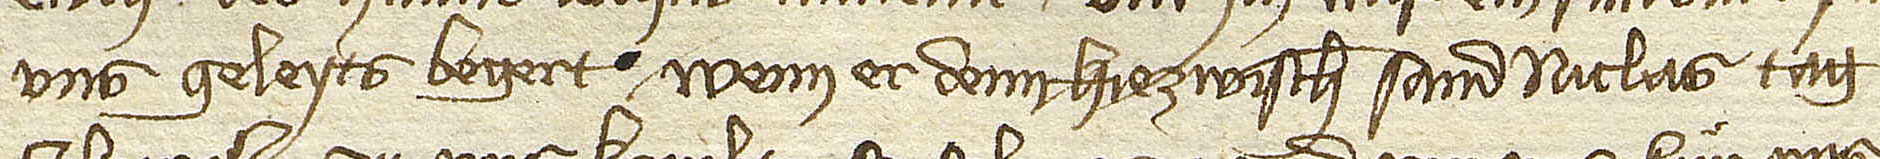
vns geleyts begert / wenn er denn hieʒwiſch* ſand Niclas tag
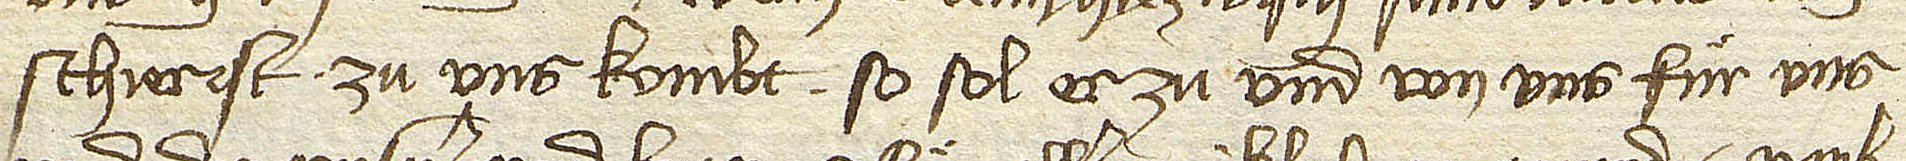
ſchieriſt . ʒu vns kombt . ſo ſol er ʒu vnd von vns für vns
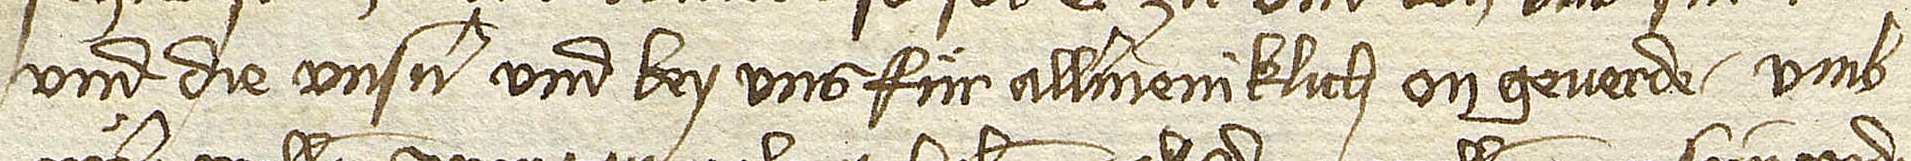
vnd die vnſ*n vnd bey vns für all*meniklich on geuerde / vmb
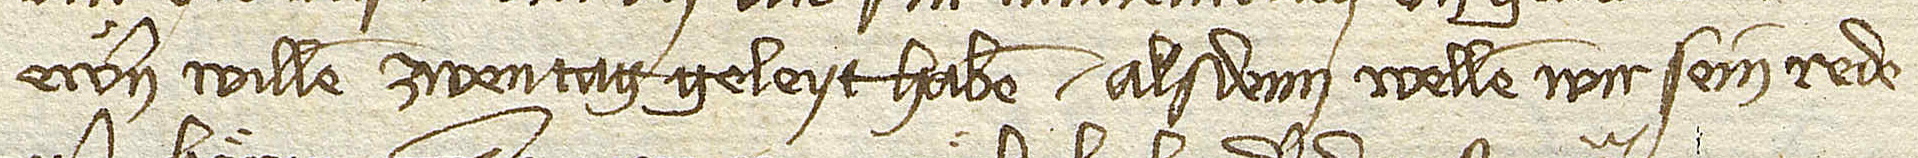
ew*n wille* ʒwen tag geleyt habe* / Alſdenn welle* wir ſein rede
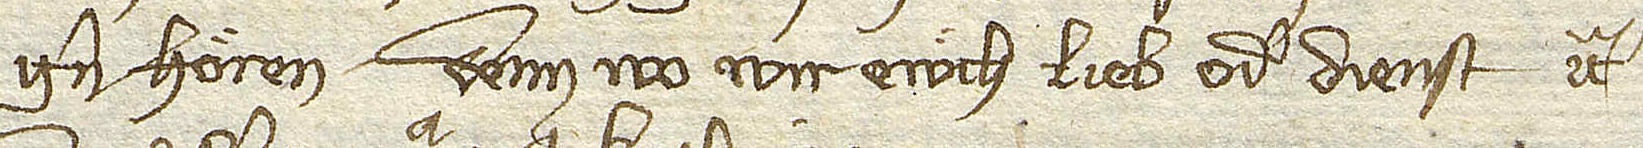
gn* hören / Denn wo wir ewch lieb od* dienſt ec*
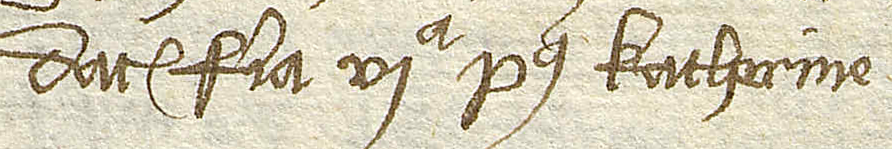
Dat* fia* vi* p* katherine
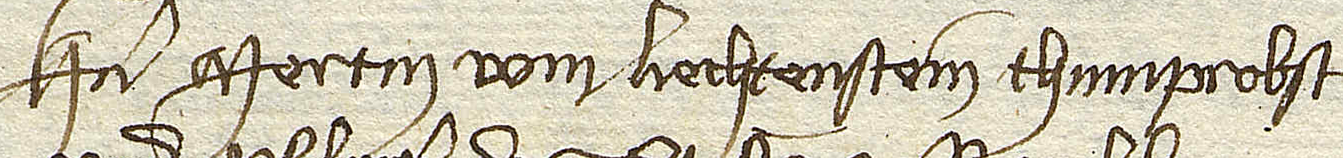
Hn* Mertin vom liechtenſtein thumprobſt
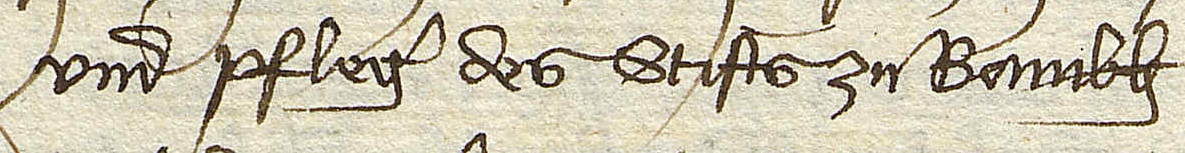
vnd pfleg* des Stifts ʒu Bamb*g
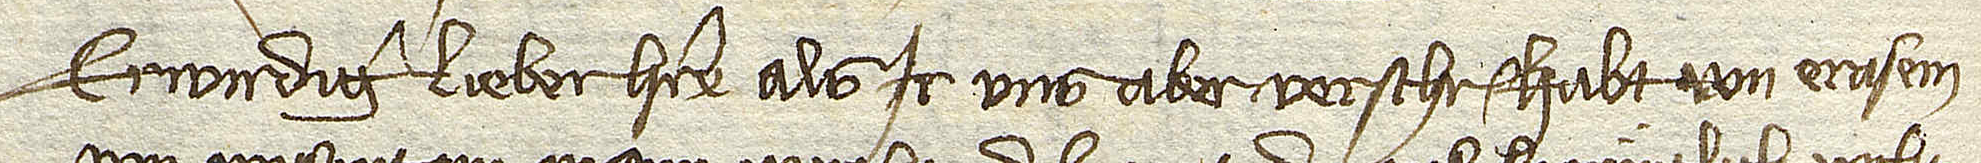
Erwirdig* lieber h*re als Ir vns aber verſchr* habt von eraſem
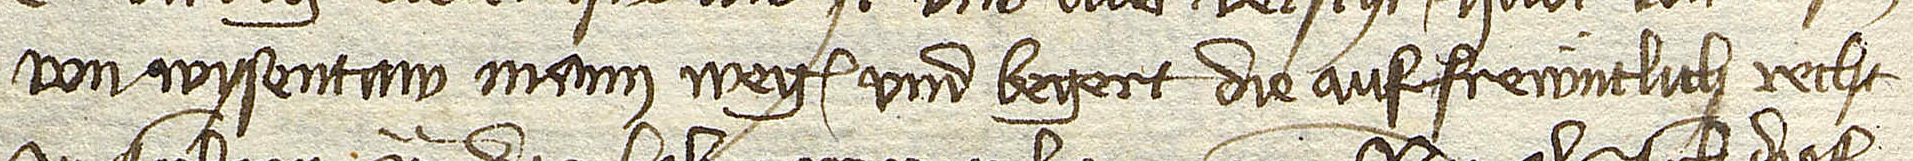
von wyſentaw mann weg* vnd begert die auf frewntlich recht
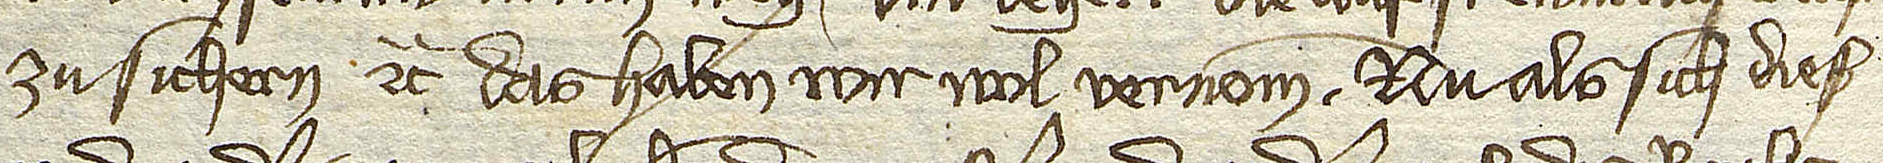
ʒu ſichern ec* das haben wir wol vernom* . Nu als ſich dieſ*
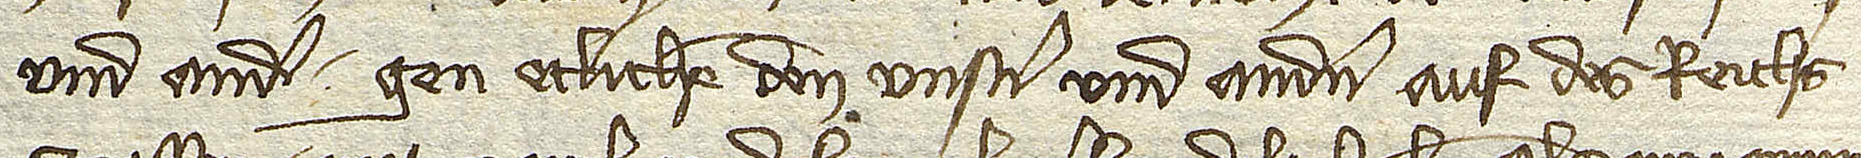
vnd and* / gen etliche* den vnſ*n vnd and*n auf des Reichs
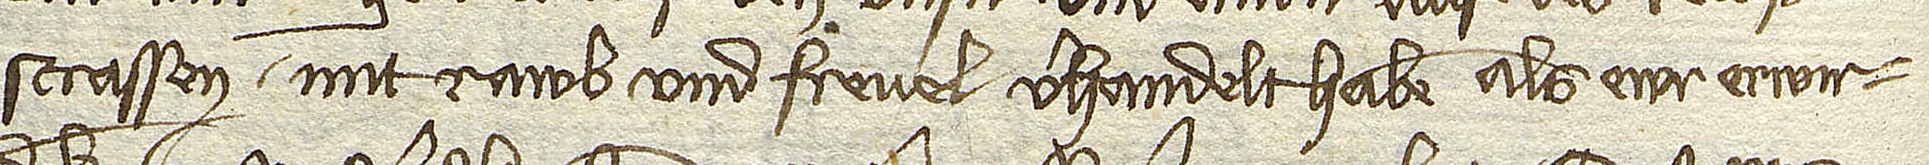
ſtraſſen / mit rawb vnd freuel v*handelt habe* als ewr erwir =
